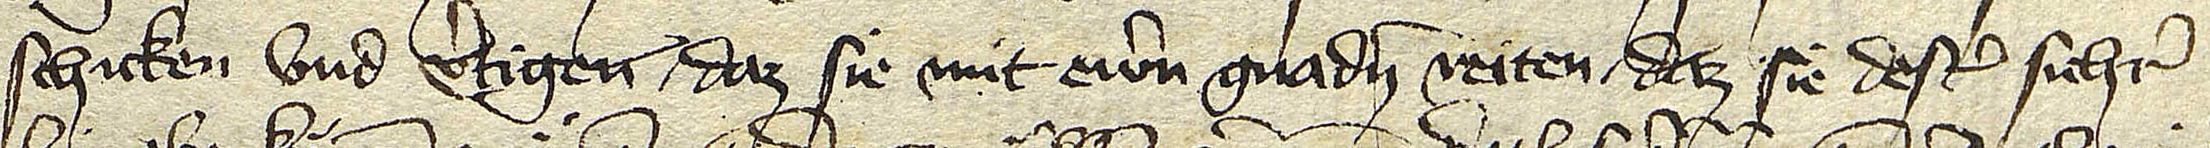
ſchicken vnd v*tigen / daʒ ſie ew*n gnadn* reiten / daʒ ſie deſt* ſichr*
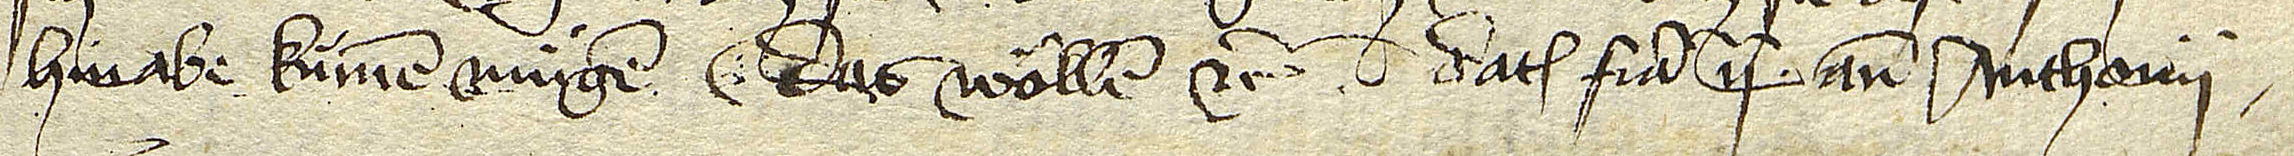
hinabe küme* müge* / Das wölle ec* . dat*fia* ii* an* Anthonii /
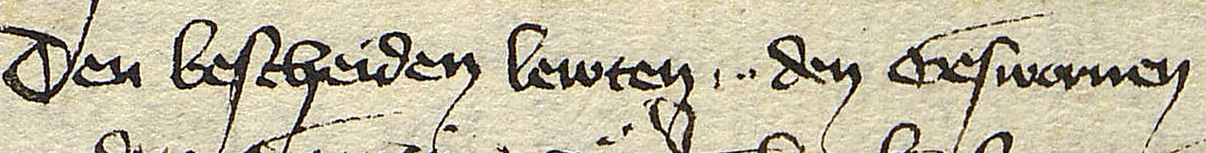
Den beſcheiden lewten . den Geſwornen
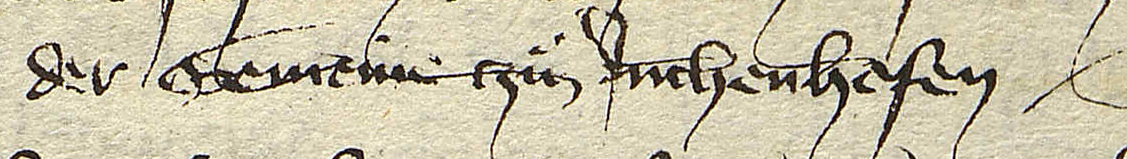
der Gemeine cʒü Inchenhofen /
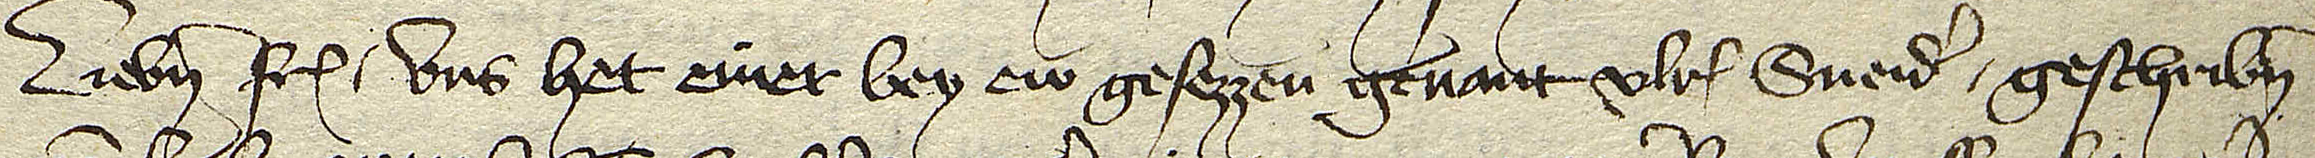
Liebn* fr* / vns het einer bey ew geſeʒʒen genant vlr* Sneid* / geſchribn*
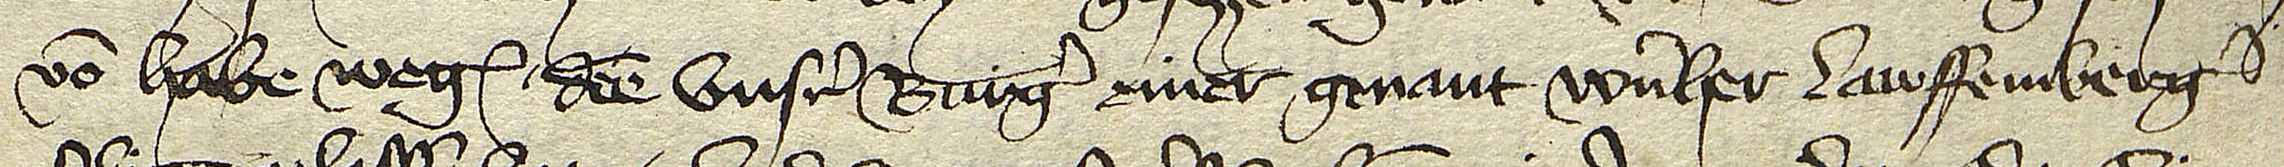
vo* habe weg* / die vnſr* Burg* einer genant wn*her lawffemberg*
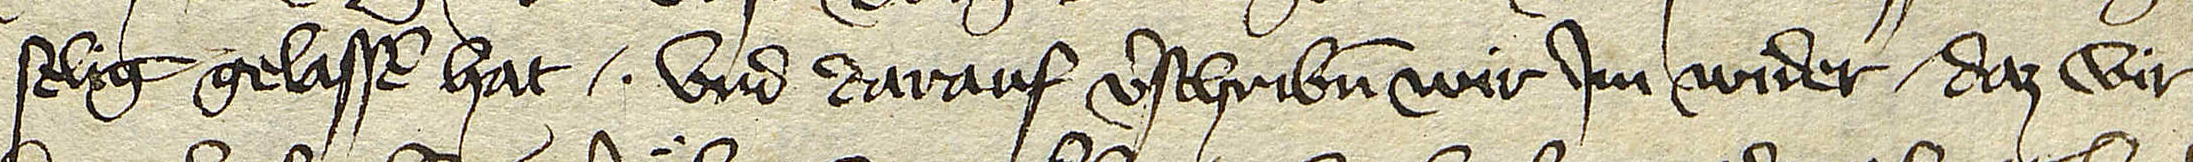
ſelig gelaſſe* hat /. vnd darauf v*ſchribn* wir Im wider / daʒ wir
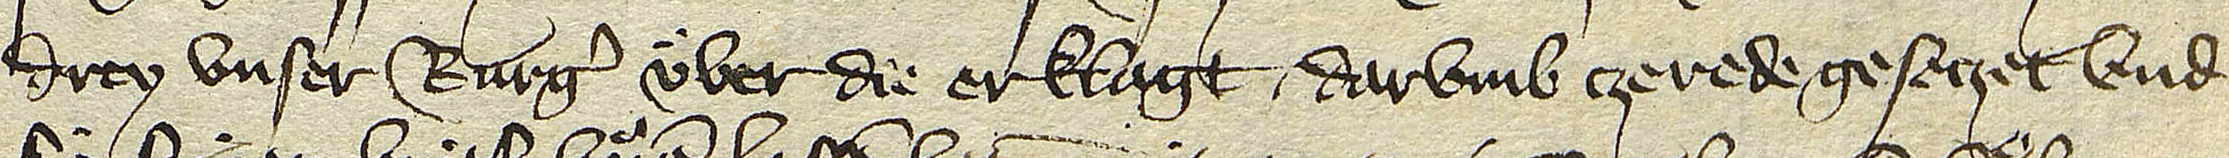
drey vnſer Burg* v̈ber die er klagt / darvmb cʒerede geſecʒet vnd
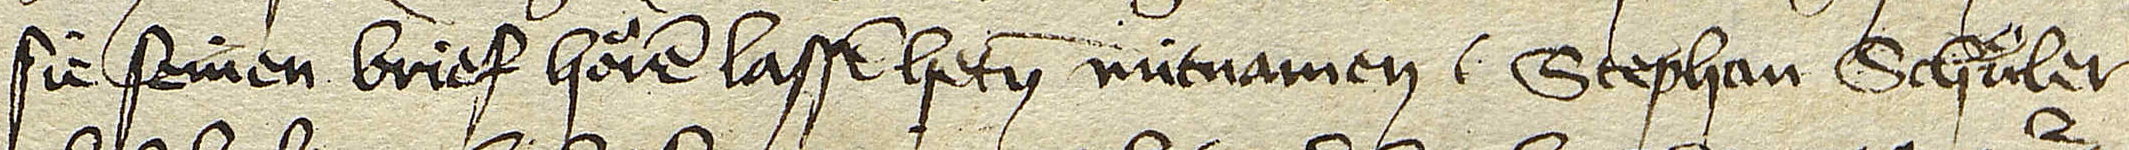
ſie ſeinen brief höre* laſſe* hetn* mitnamen / Stephan Schüler
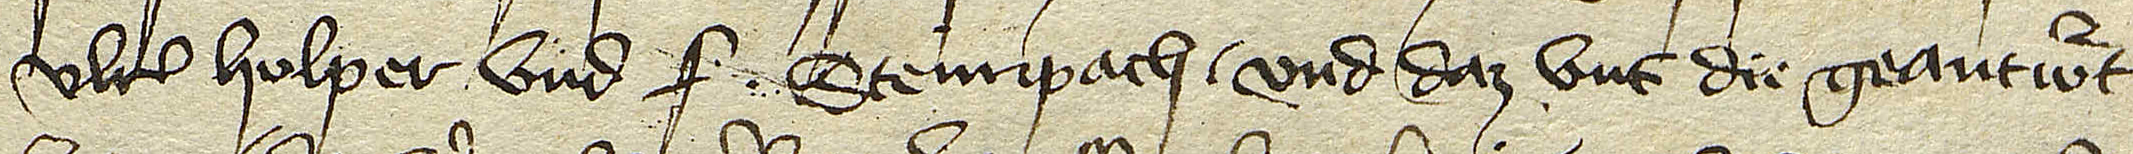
vlr* holper vnd f . Steimpach / vnd daʒ vns die geantw*t
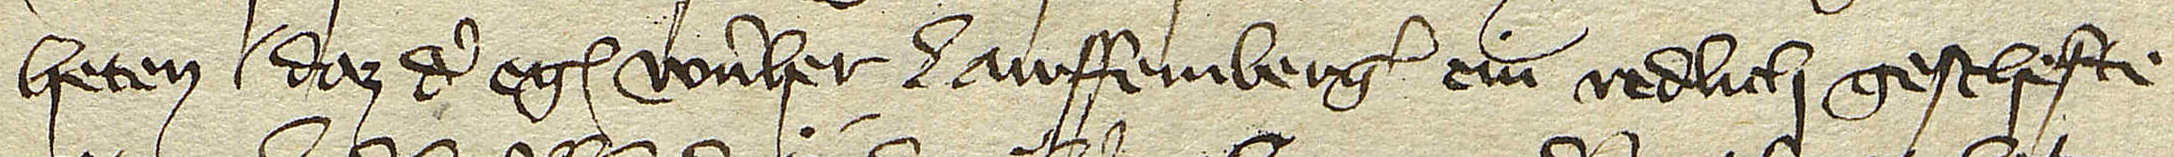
heten / daʒ d* eg* wn*her lawffemberg* ein redlich geſchefte
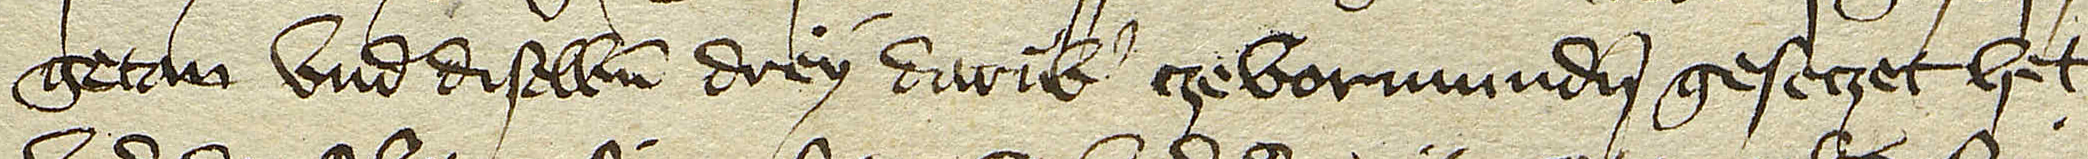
getan vnd dieſelbn* drey darüb* cʒevormundn* geſecʒet het
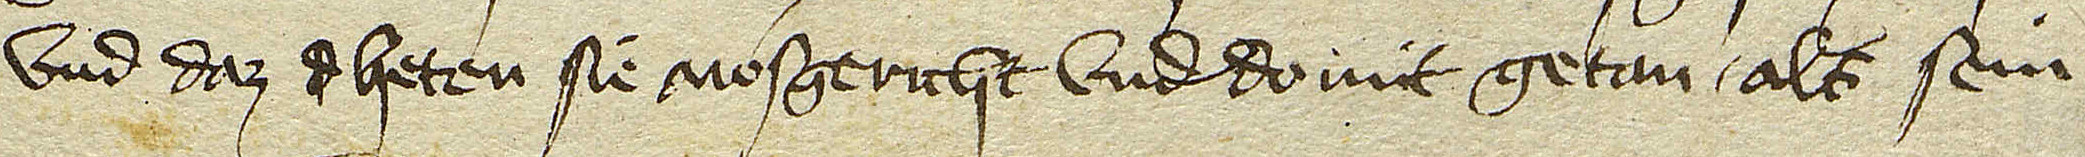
vnd daʒ d heten ſie awſgericht vnd domit getan / als ſein
